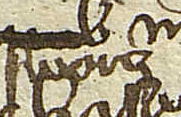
ſwarcʒ
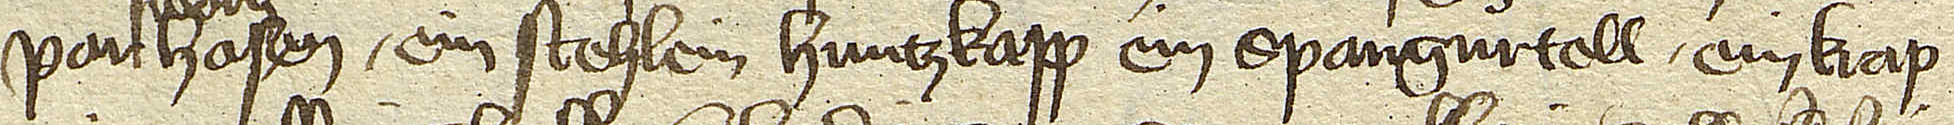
par hoſen / ein ſtehlein huncʒkapp ein Spangürtell / ein krap
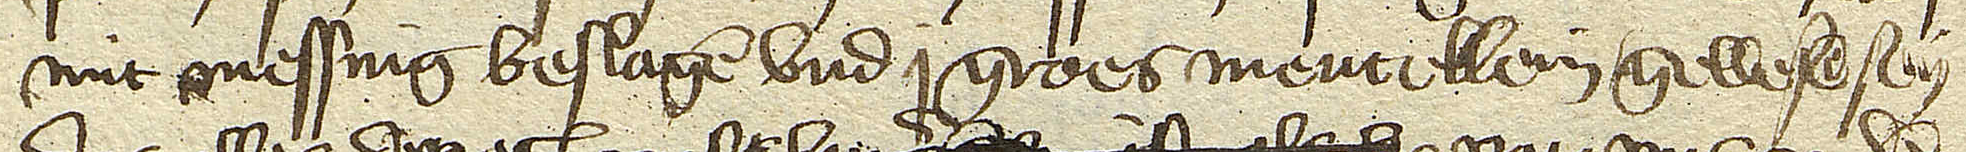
mit meſſing beſlage* vnd i groes mentellein geweſe* ſey
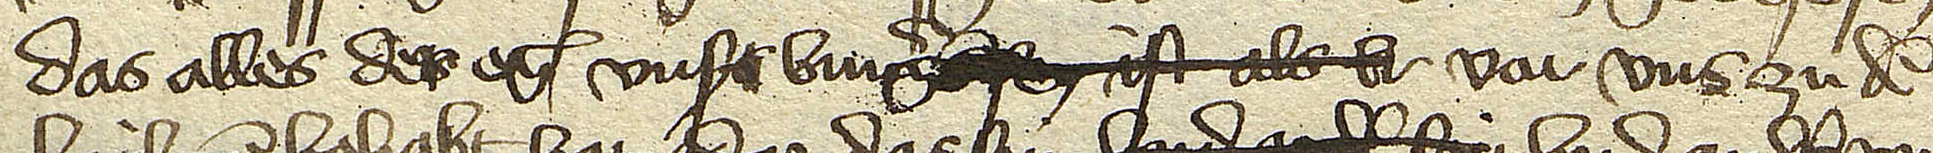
dasalles der eg* vnſ*s burg*s ſey iſt als Er von vns cʒu d*
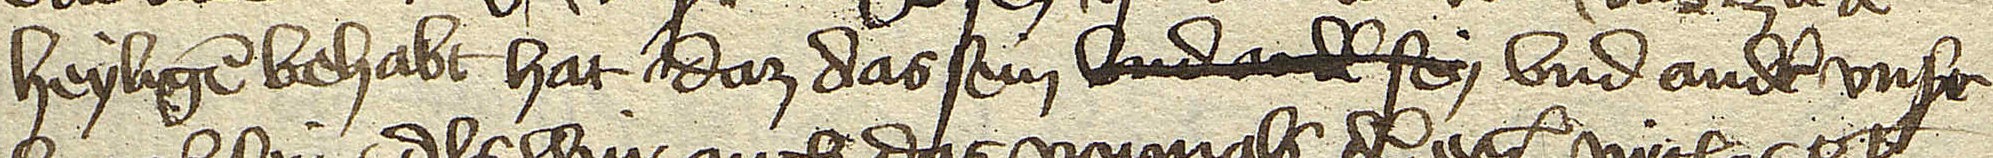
heylige* behabt hat / daʒ das ſein vnd and* ſey vnd andr* vnſ*r
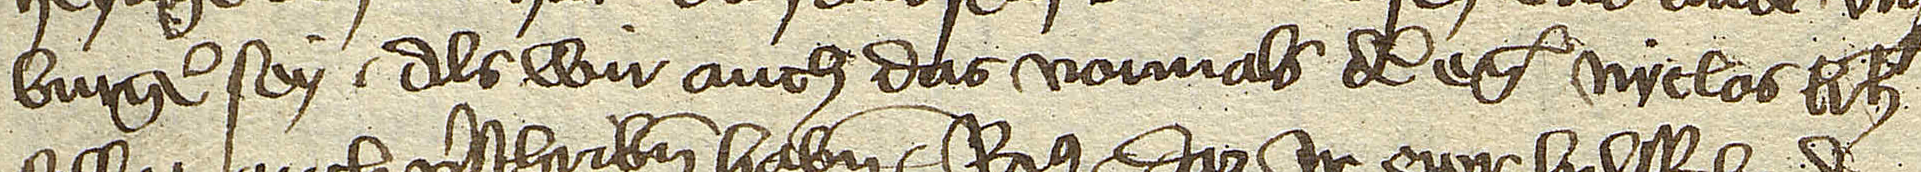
burge* ſey / Als wir auch das vormals d* eg* Nyclas Erh*
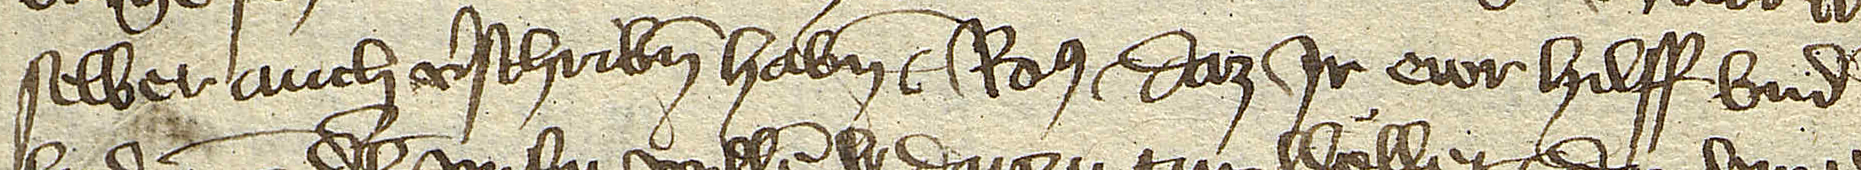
ſelber auch v*ſchribn* habn* / Ro* / daʒ Ir ewr hilff vnd
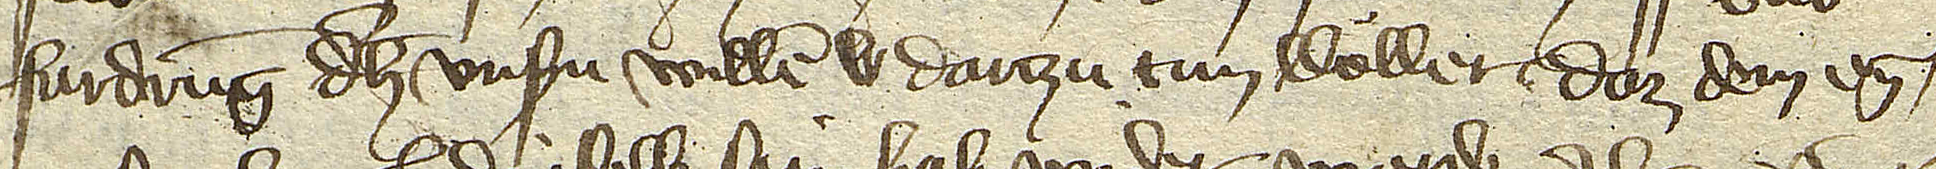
furdrug d*h vnſ*n wille* Er darcʒu tun wöllet / daʒ dem eg*
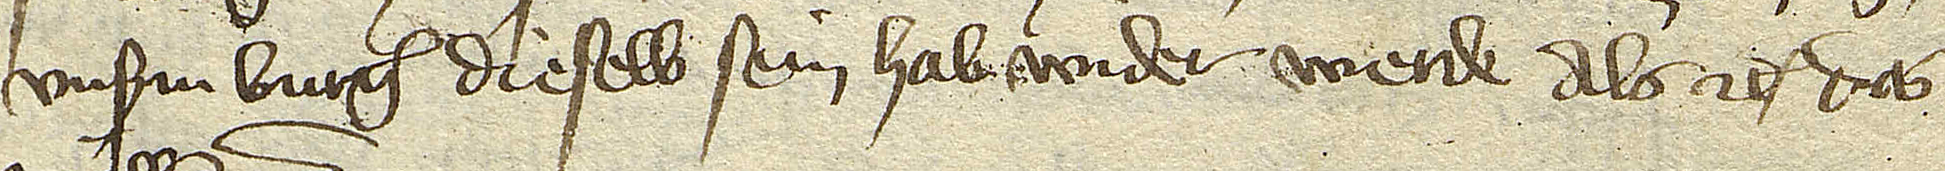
vnſ*m burg* dieſelb ſein hab wider werde Als ec* das
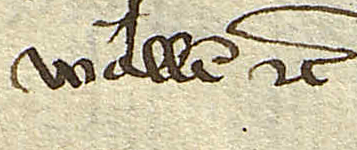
wölle ec*
